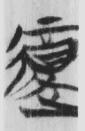復
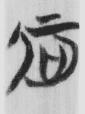何
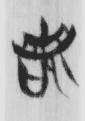若
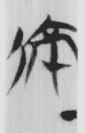倞
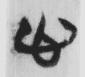心
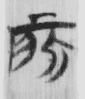所
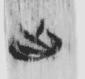出
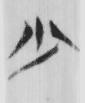少
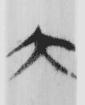大
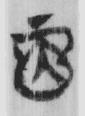因
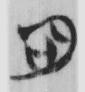名
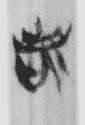若
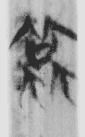{向䖵}
